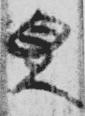見
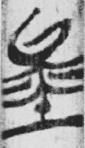○（舜）
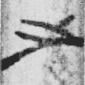之
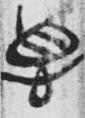惪（德）
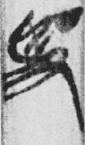○（賢）
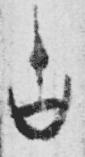古（故）
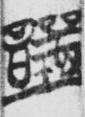讓
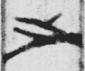之
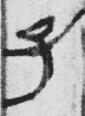子
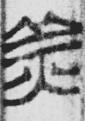羔
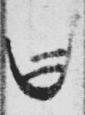曰
